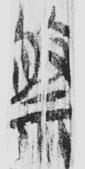祭
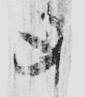又（有）
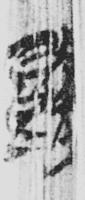○（雉）
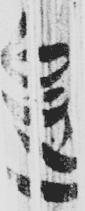○（雊）
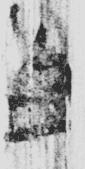於
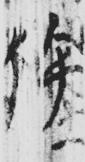○（彜）
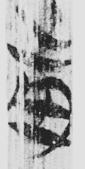前
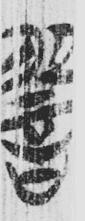○（召）
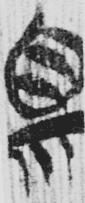祖
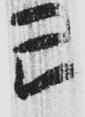己
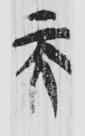而
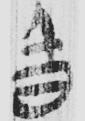昏（問）
